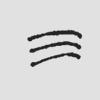三
